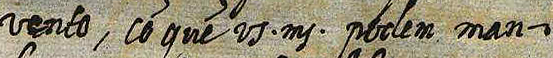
vento, cō quē vs. ms. podem man
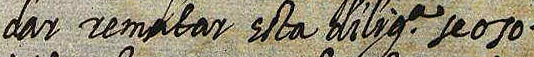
dar rematar Esta dilig.a se o so
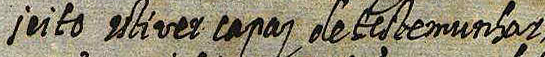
jeito Estiver capaz de testemunhar,
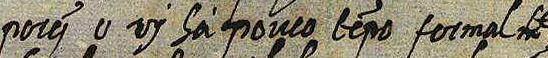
porq̄ o vj há pouco tēpo formalmte
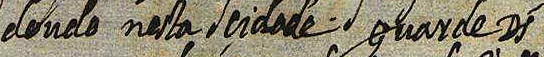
doudo nesta çidade. guarde Ds̄
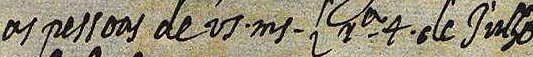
as pessoas de vs. ms. Lx.a 4. de Iulho
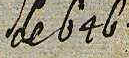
de 646.
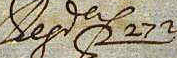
Regda f 272
